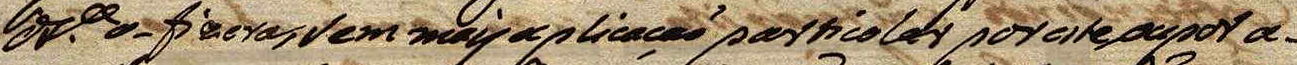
o s.ce o-fizera, sem mais aplicaçaõ particolar por este ou por a
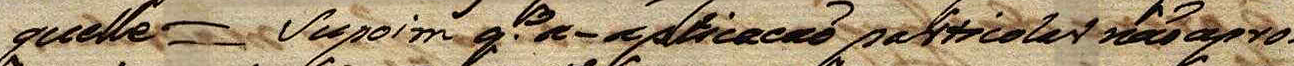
quelle = supoim q. a - aplicaçaõ particolar naõ apro
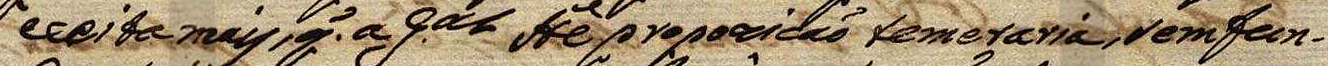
veita mais, q̄ a G.al Hê propozicaõ temeraria, sem fun
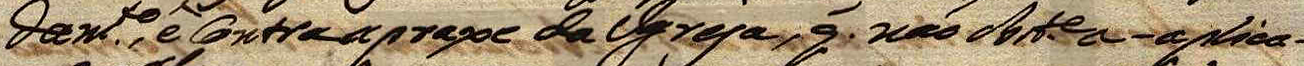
dam.to, ê Contra a praxe da Igreja, q̄. naõ obst.e a - aplica
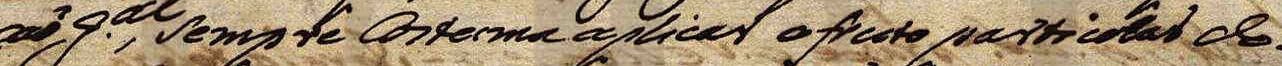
çaõ G.al, sempre Costuma aplicar o fruto particular do
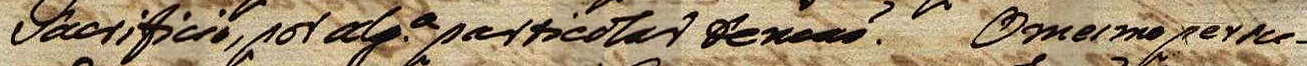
sacrificio, por alg.a particular tencaõ. O mesmo persu
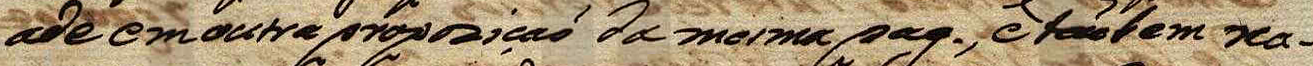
ade em outra propoziçaõ da mesma pag., ê taõbem na
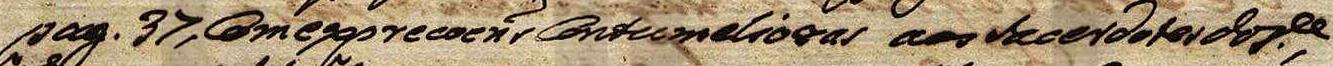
pag.37, Com exprecoeñs Contumeliozas aos sacerdotes do s.ce
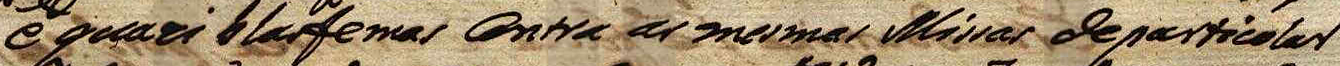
e quazi blasfemas Contra as mesmas Missas de particólar
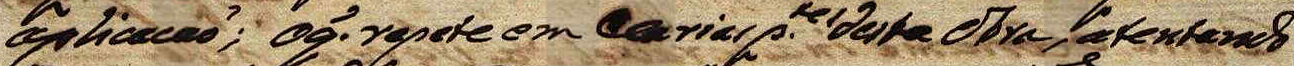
aplicacaõ; o q̄ repete em varias p.tes desta obra, atentando
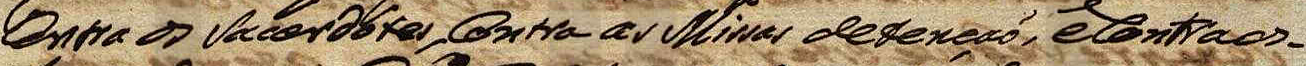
Contra os sacerdotes, Contra as Missas de tençaõ, ê Contra os
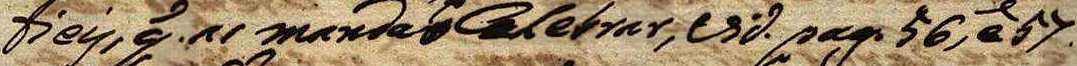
fieis, q̄. as mandaõ Celebrar, vid. pag. 56, ê 57.
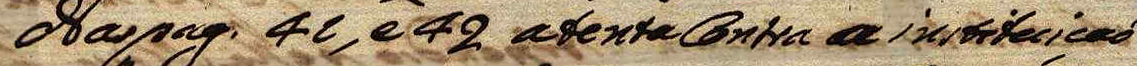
Na pag. 41, ê 42 atenta Contra a instituiçaõ
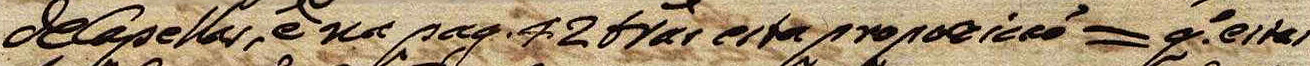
de Capellas, ê na pag. 42 trâs esta propozicaõ = q.o estas
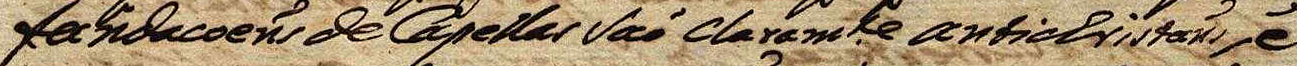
fundacoeñs de Capellas saõ claram.te antichristañs, ê
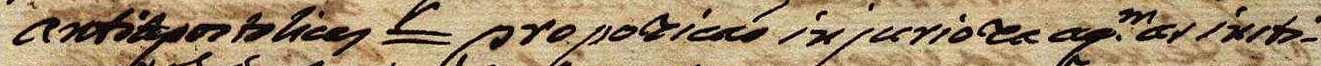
antiApostolicas = prepozicaõ injurioza a q.m as insti
